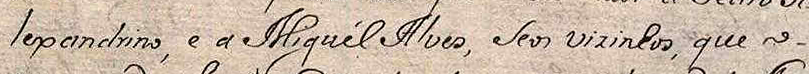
lexandrino, e a Miguel Alves, seos vizinhos, que o
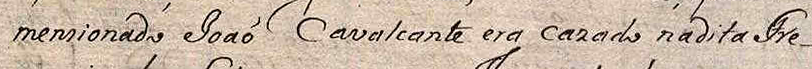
mensionado Ioaõ Cavalcante era cazado na dita Fre
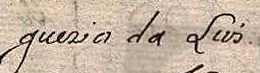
guezia da Lús
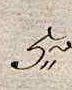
5.o
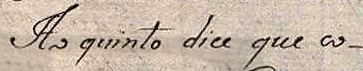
Ao quinto dice que co
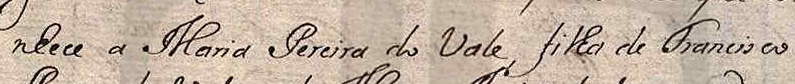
nhece a Maria Pereira do Vale, filha de Francisco
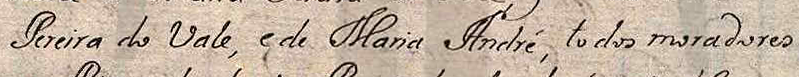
Pereira do Vale, e de Maria André, todos moradores
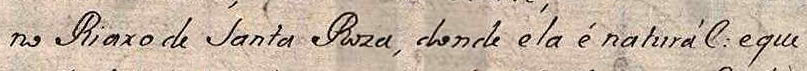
no Riaxo de Santa Roza, donde ela é natural: e que
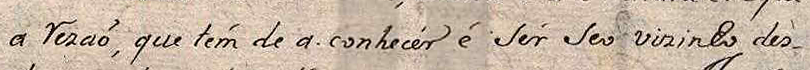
a Rezaõ, que tem de a conhecer é ser seo vizinho des
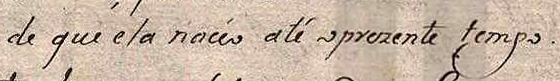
de que ela nacéo até o prezente tempo.
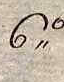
6o
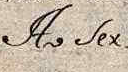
Ao sex
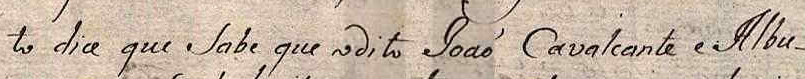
to dice que sabe que o dito Ioaõ Cavalcante e Albu
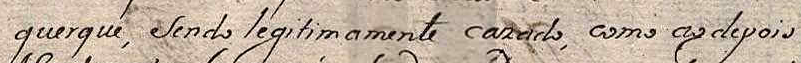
querque, sendo legitimamente cazado, como ao depois
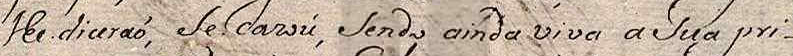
lhe diceraõ, se cazou, sendo ainda viva a sua pri
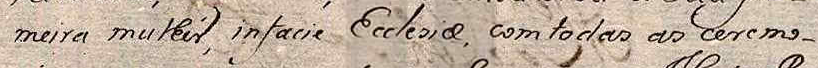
meira mulhér, infacie Ecclesiæ, com todas as ceremo
